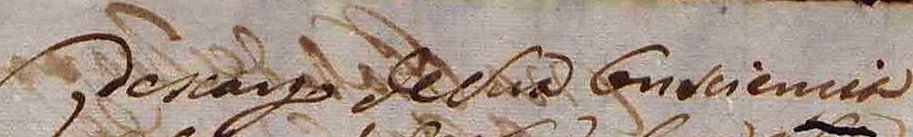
descargo de sua consciencia
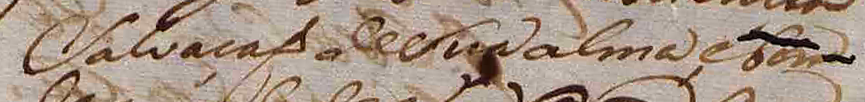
Salvaçaõ de Sua alma, e bom
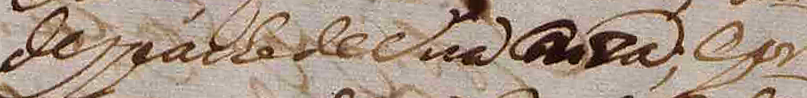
despacho de sua cauza, e por
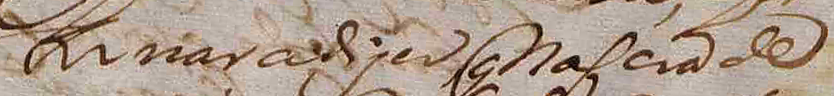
tonar a dizer q̄ naõ era de
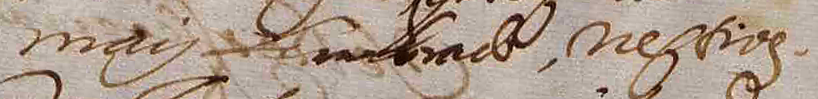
mais Lembrado, nē tive
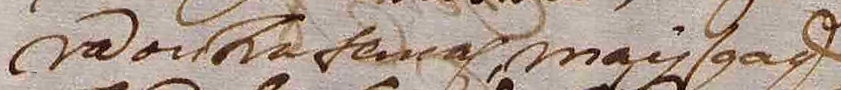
ra outra tençaõ, mais q̄ a q̄
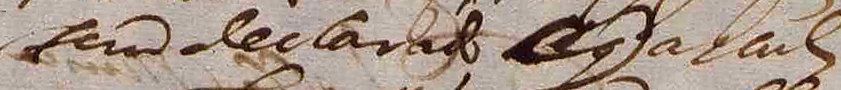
tem declarado, e q̄ as cul
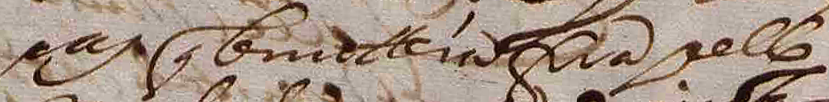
pas q̄ cometteu fora pello
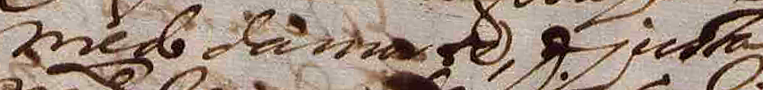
medo da morte, q̄ justa
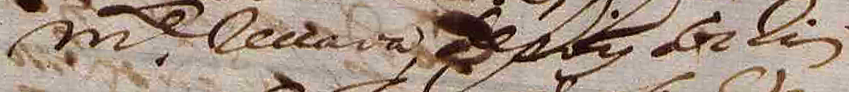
m.te Receava, depois dos Ri
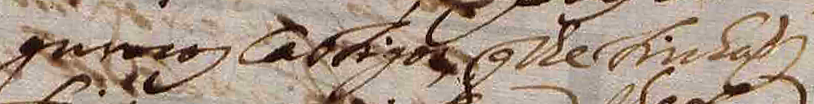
gurozos castigos, q̄ lhe tinhaõ
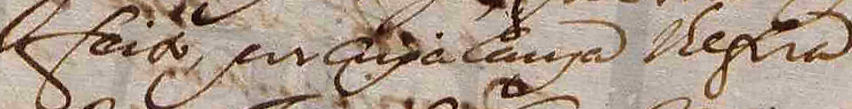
feito, por cuja cauza lhe fora
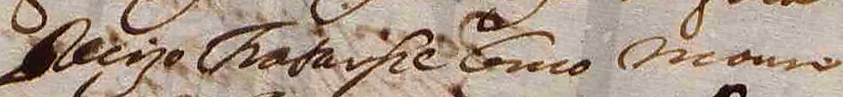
pRecizo tratarsse Como Mouro
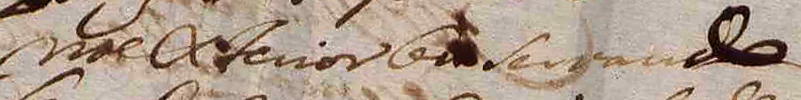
no exterior Conservando
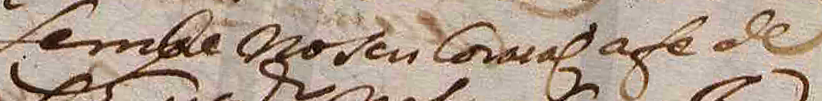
sempRe no seu Coraçaõ a fe de
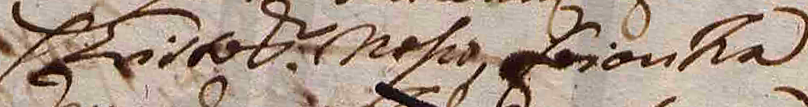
Christo s.r nosso, foi outra
